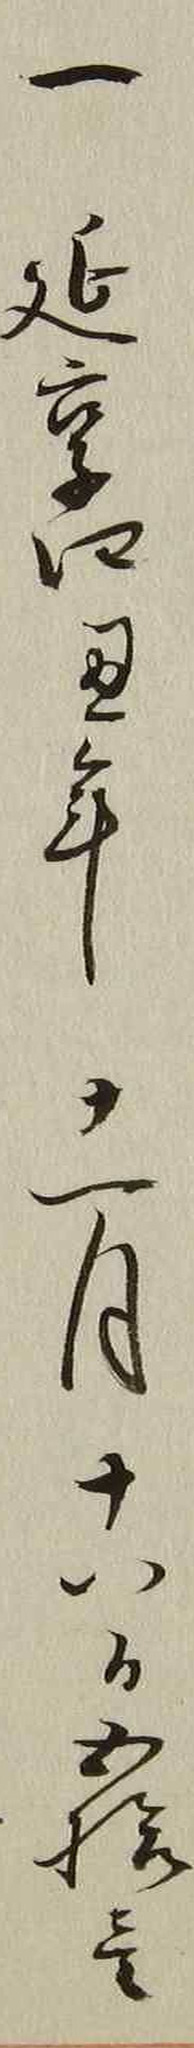一延享四丑年十一月十八日五拾壱
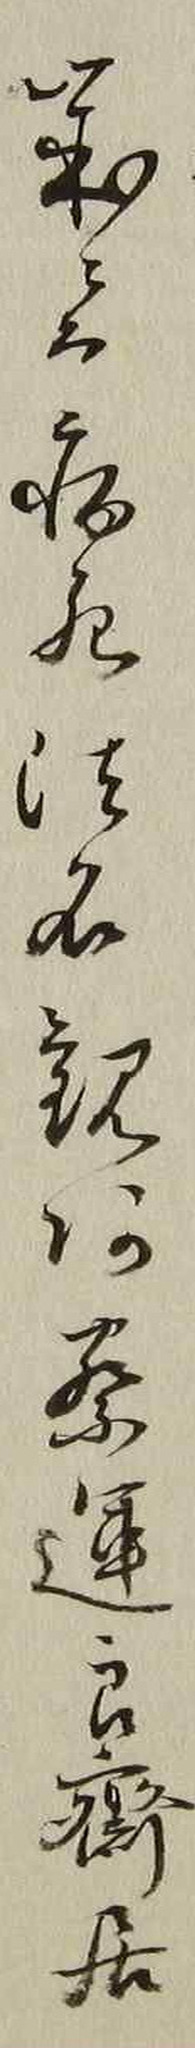歳ニ而病死法名観阿察運良斎居
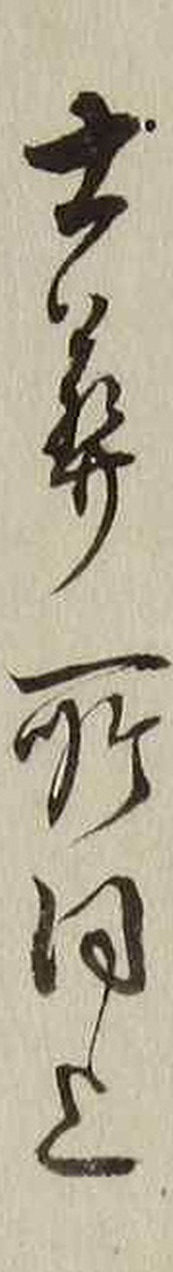士葬所同上
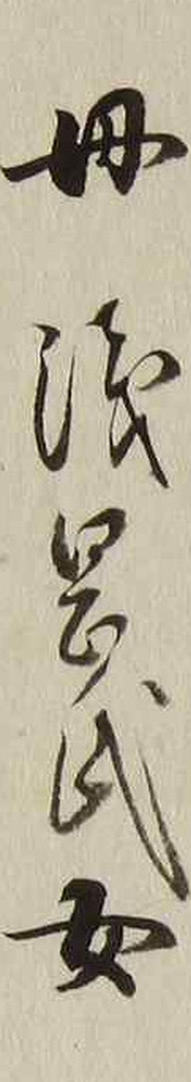母浅岡氏女
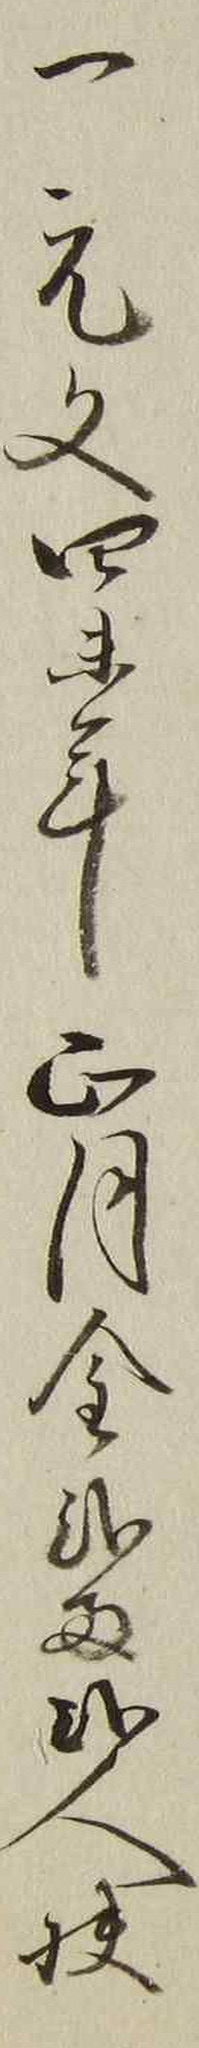一元文四未年正月金弐両弐人扶
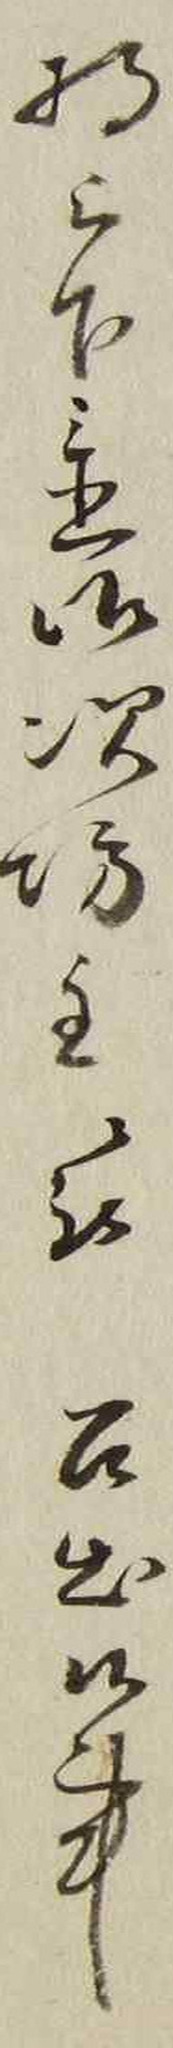持被下置御次坊主ニ被召出候事
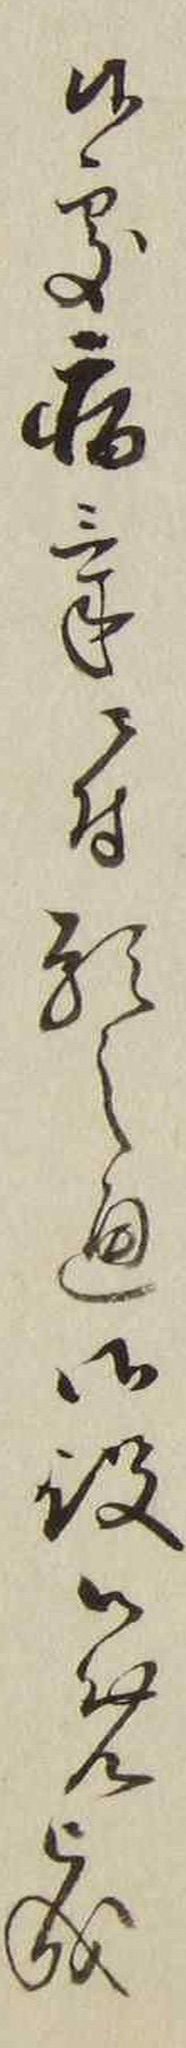候処病気ニ付願之通御役御免被成

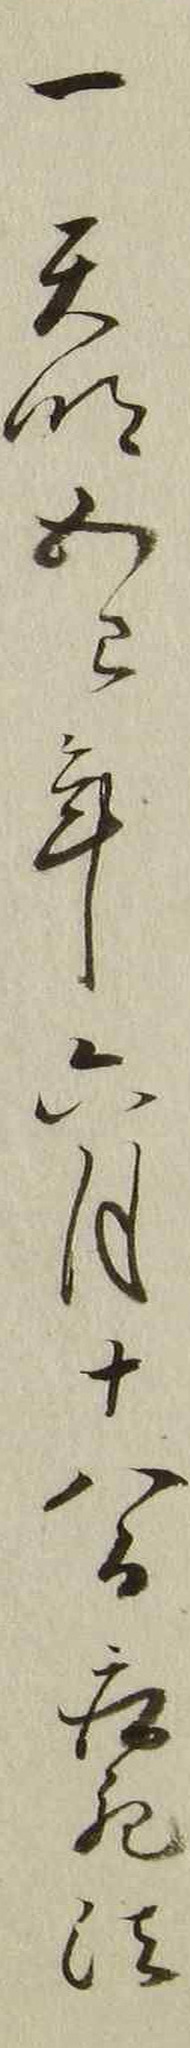一天明五巳年六月十八日病死法
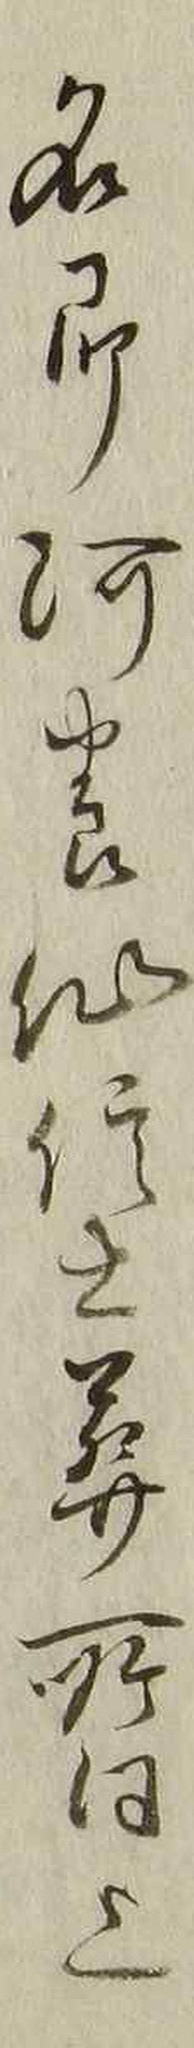名郎阿養仙信士葬所同上
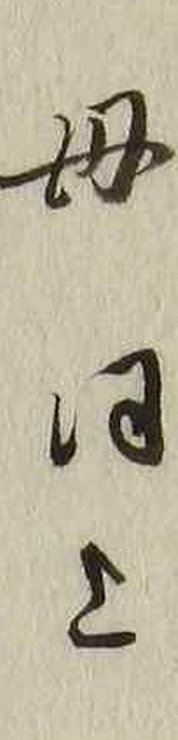母同上
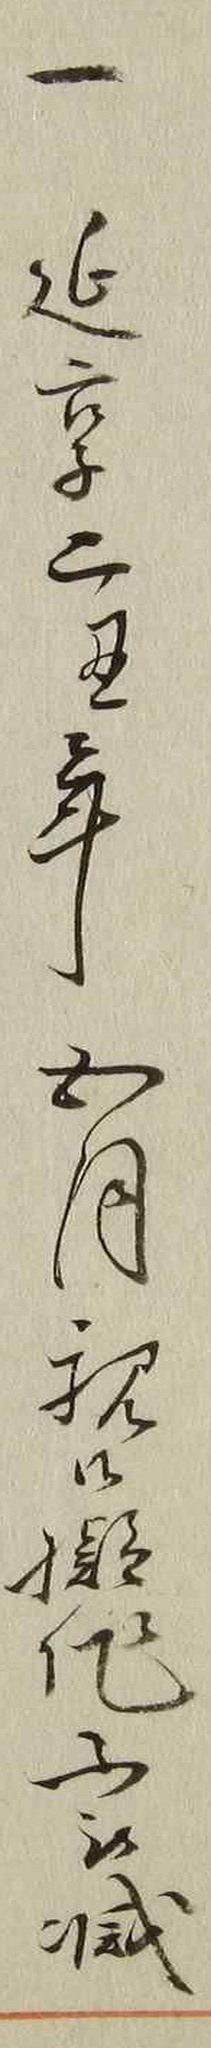一延享二丑年五月親御擬作不被減
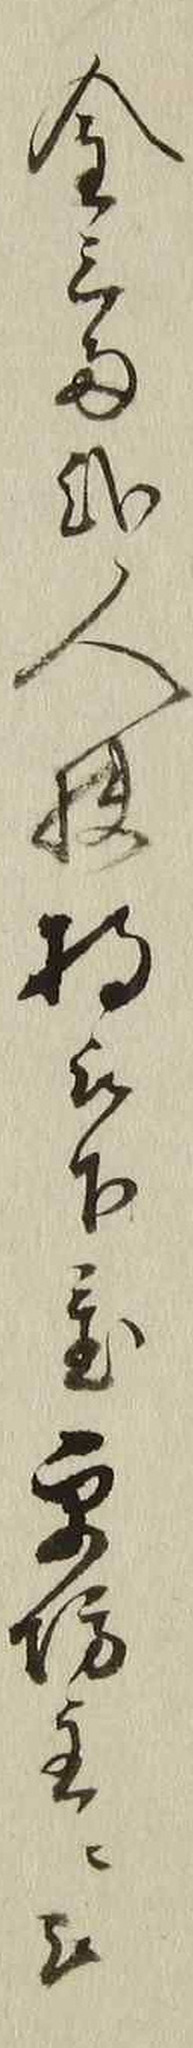金三両弐人扶持被下置平坊主ニ被
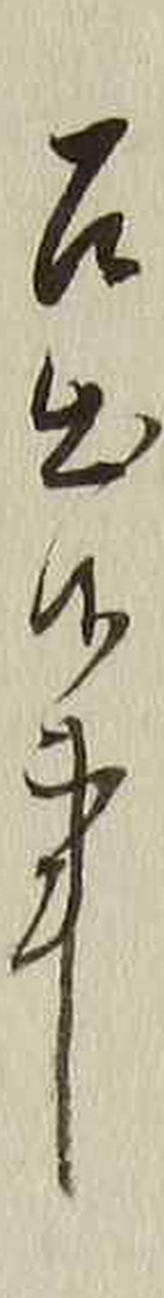召出候事
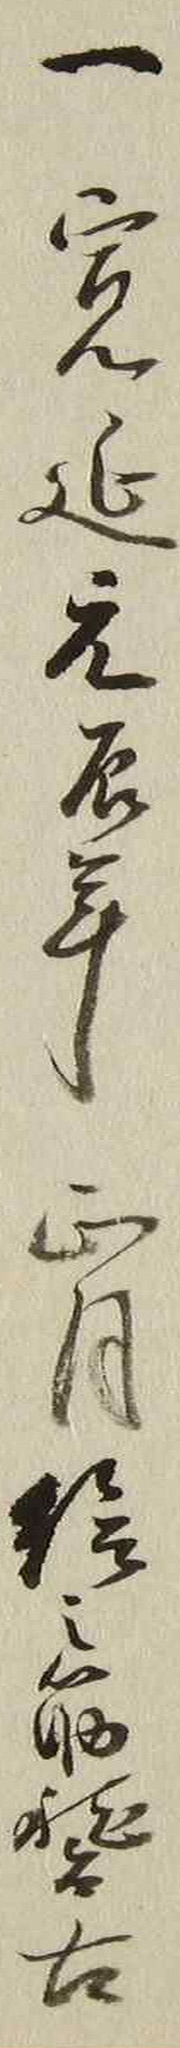一寛延元辰年正月絵之筋稽古
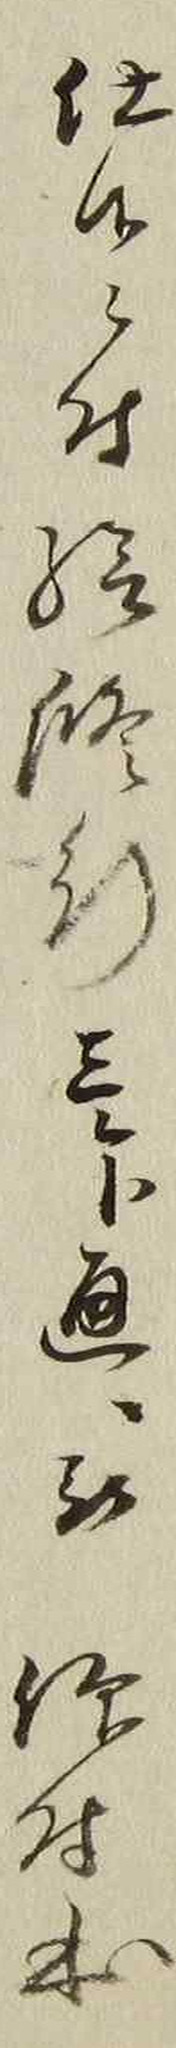仕候ニ付絵修行壱卜通ニ被仰付本
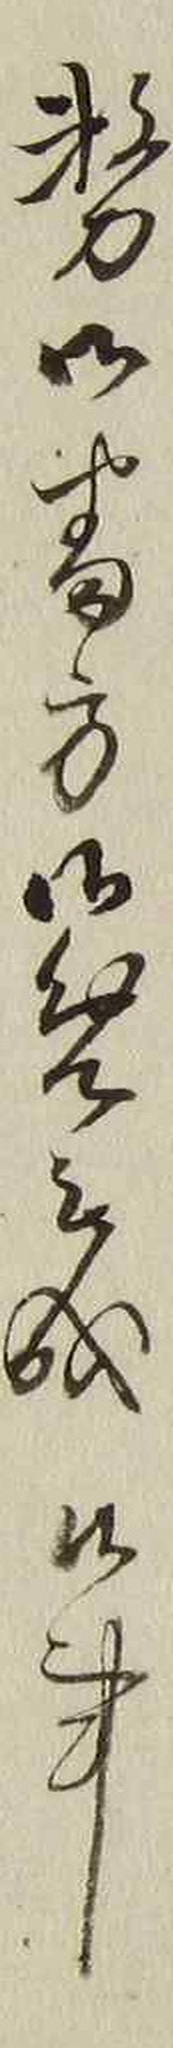務御番方御免被成候事
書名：諸士系譜　巻之132　た之部8
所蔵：会津若松市立会津図書館
